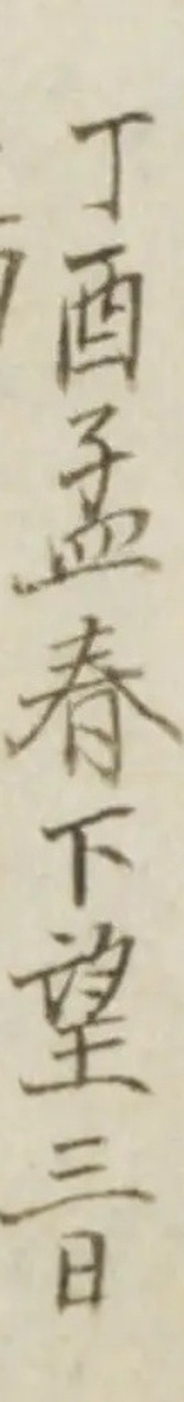丁酉孟春下望三日
